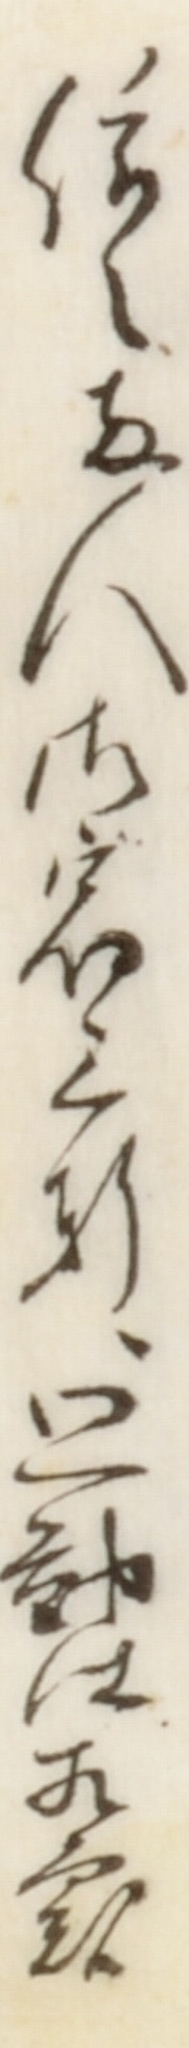依之両人御宿三軒へ、廻勤仕相窺
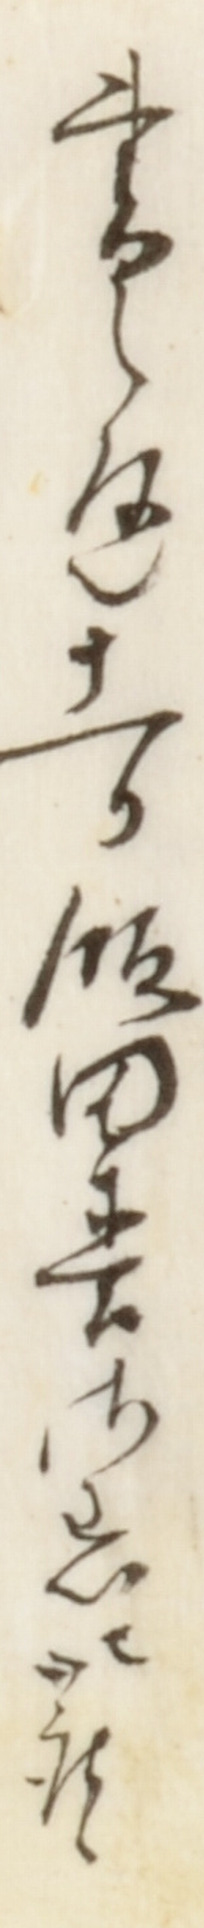書之通十一日飯田表御着ニ御座候
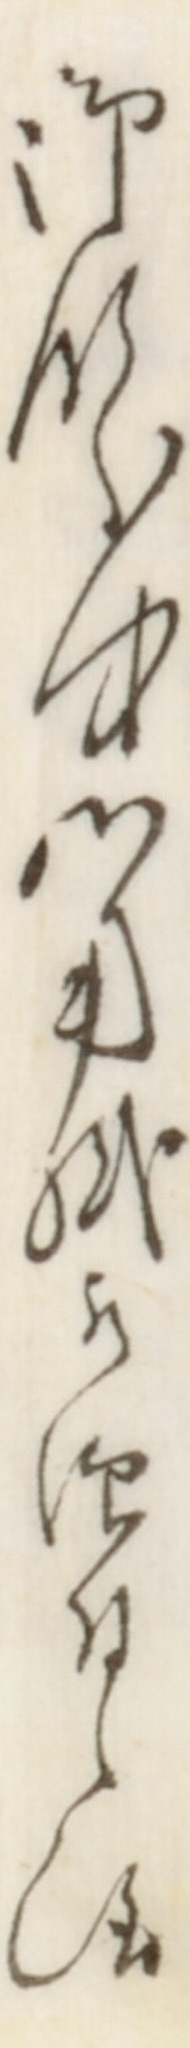御領分中御用掛被仰付候趣

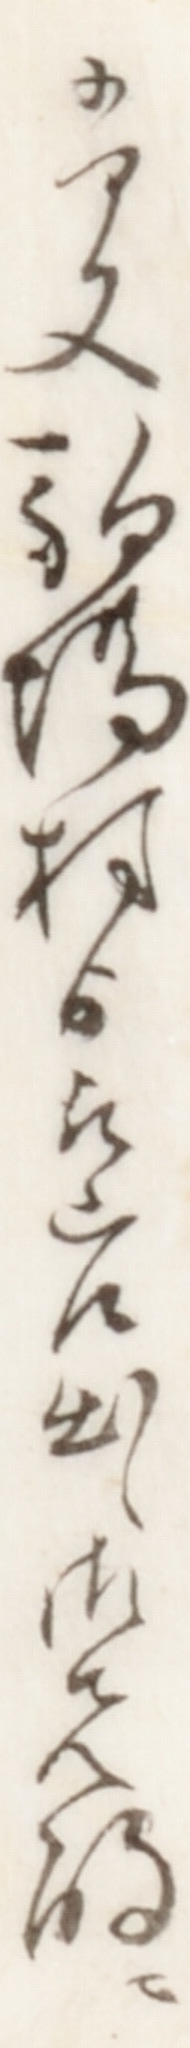尚又駒場村より被差出候御先触ニ
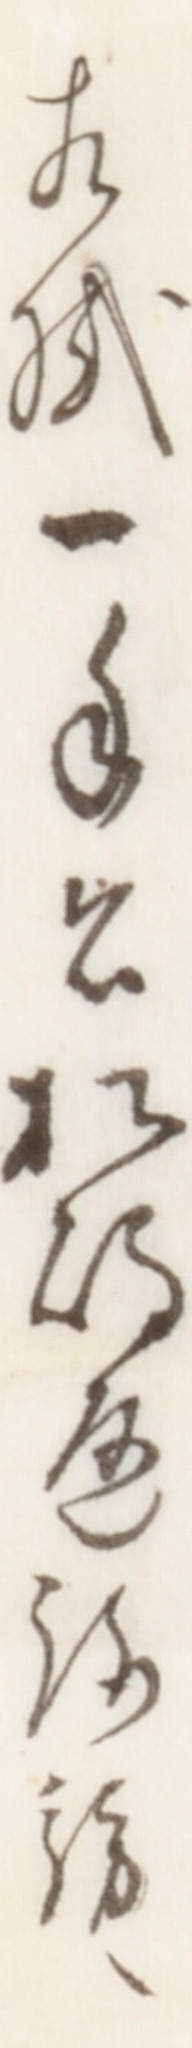相掛一手者松嶋通諏訪へ
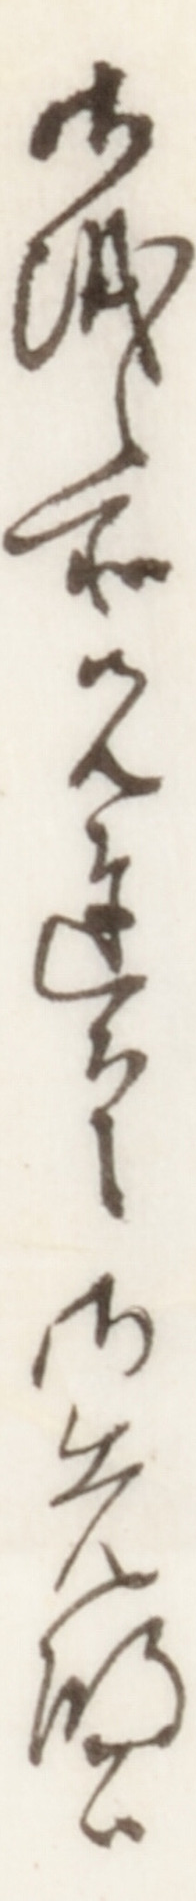御掛之所先達而之御触者
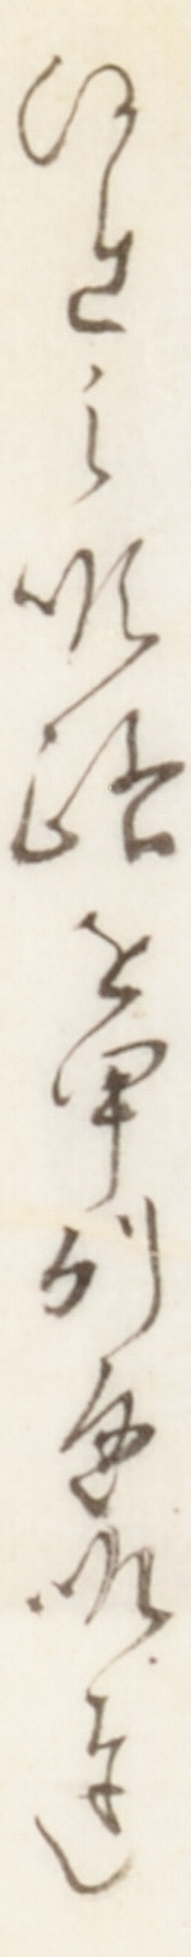何れ之順路を甲州通順達
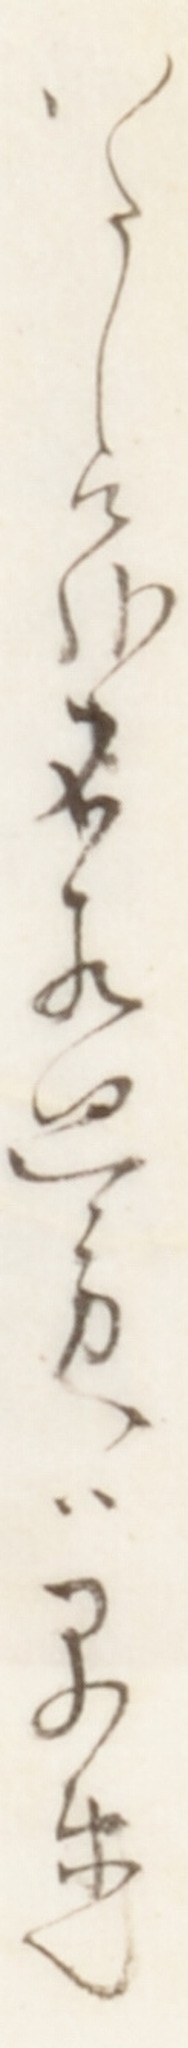いたし候哉不相廻方ヘハ早速
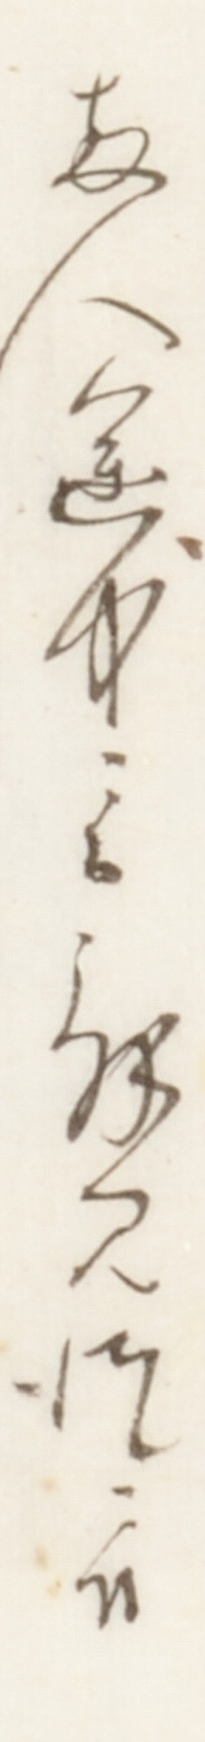両人途中ニ而拝見仕候ニ而
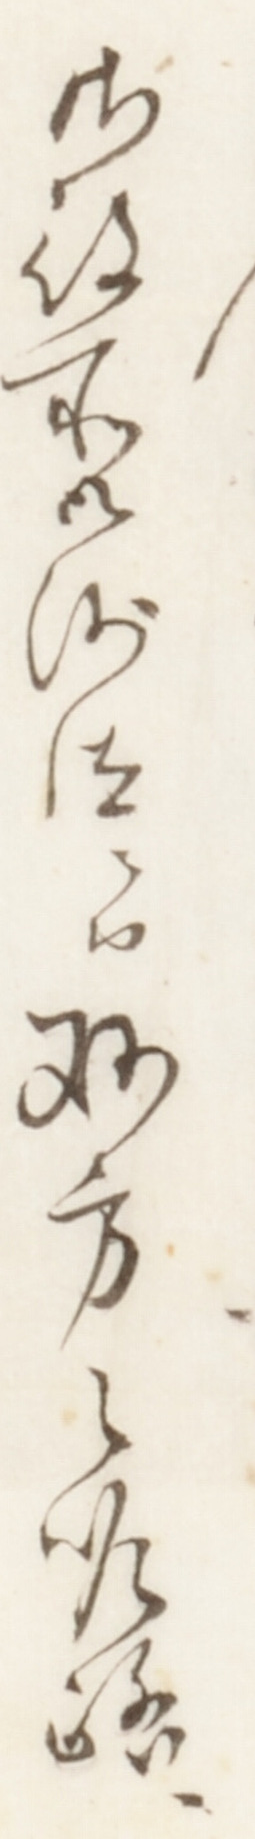御役所御沙汰ニ而双方之順路へ
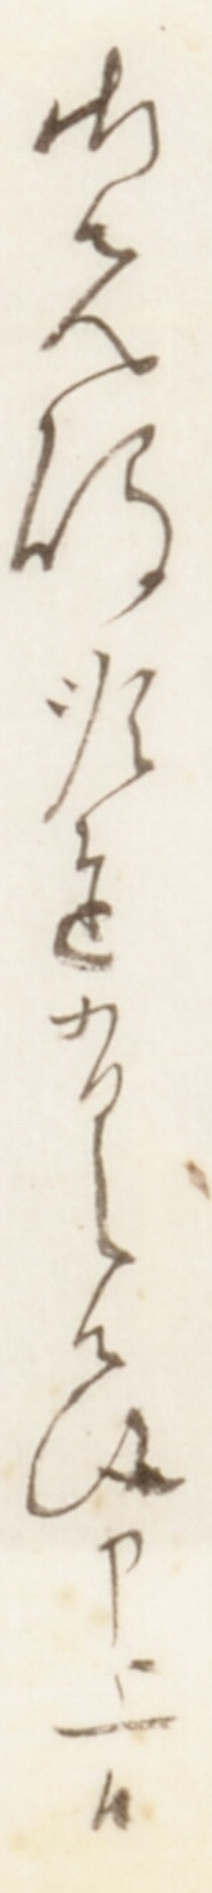御先触順達有之候趣申上候
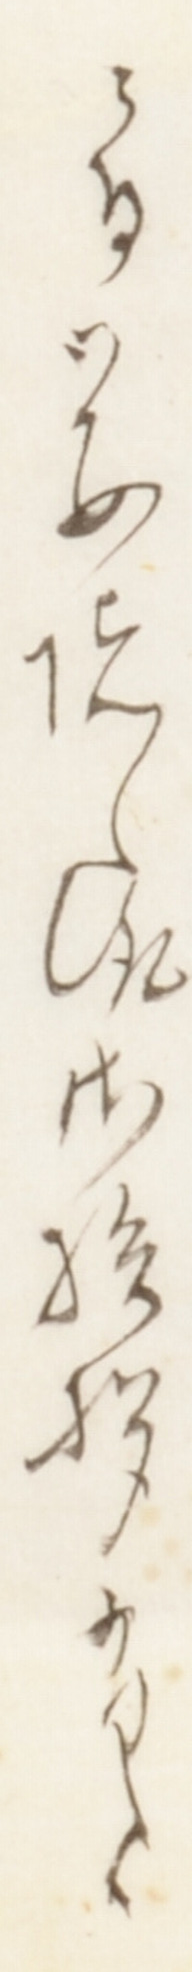ニ付御安堵之趣御挨拶有之候
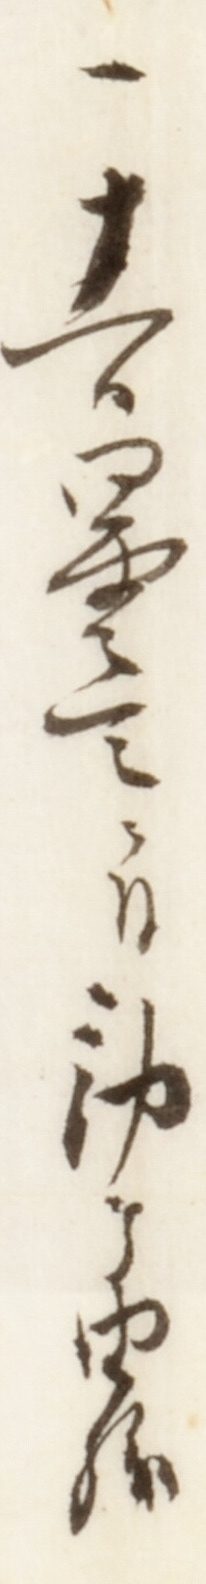一十一日曇天ニ付勘ケ由様
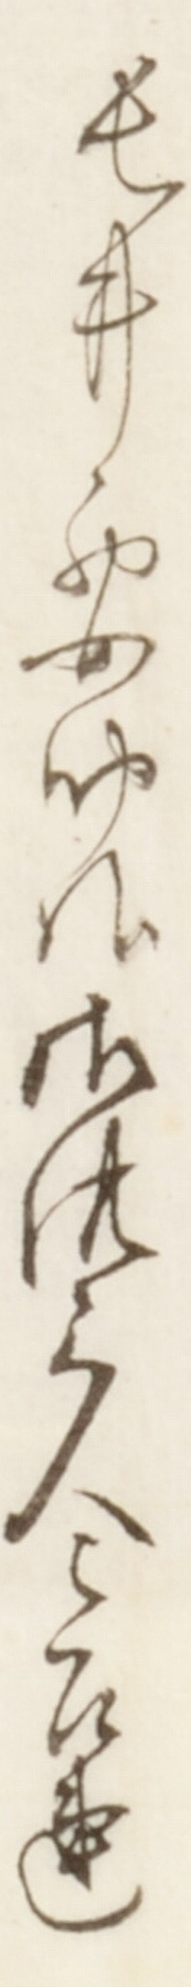永井要助様御供三人被召連
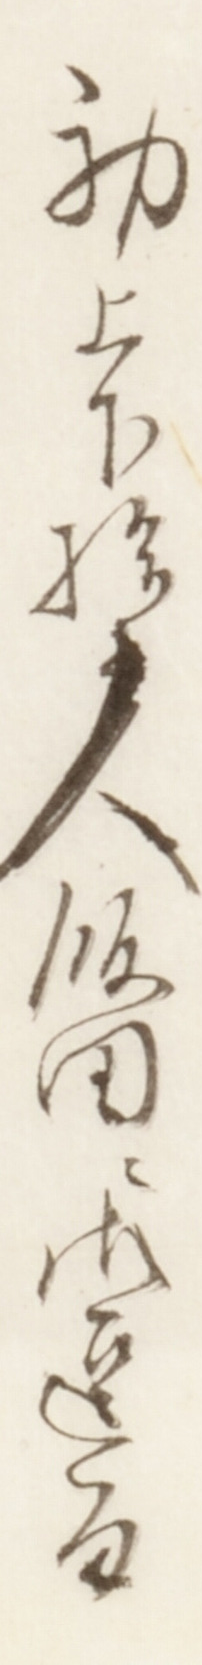初上下拾人飯田ニ御逗留
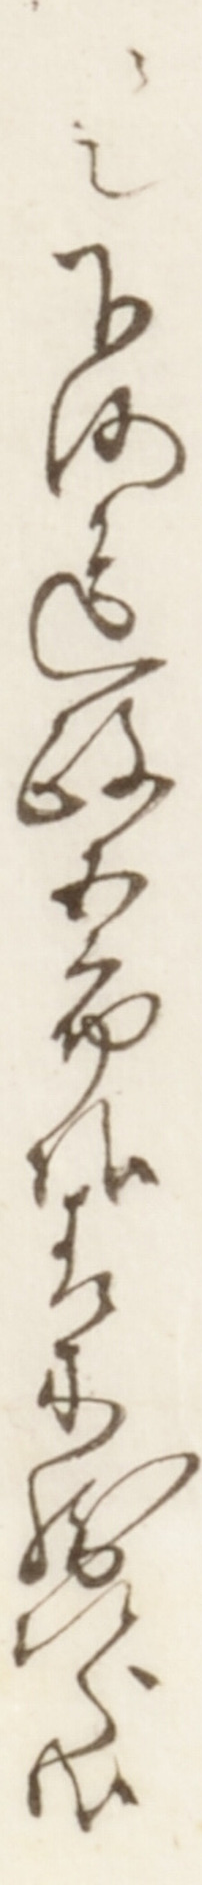ニて下河辺政五郎様青木勝次郎様
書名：御測量諸事控
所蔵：伊那市立高遠町図書館・合同会社AMANE
